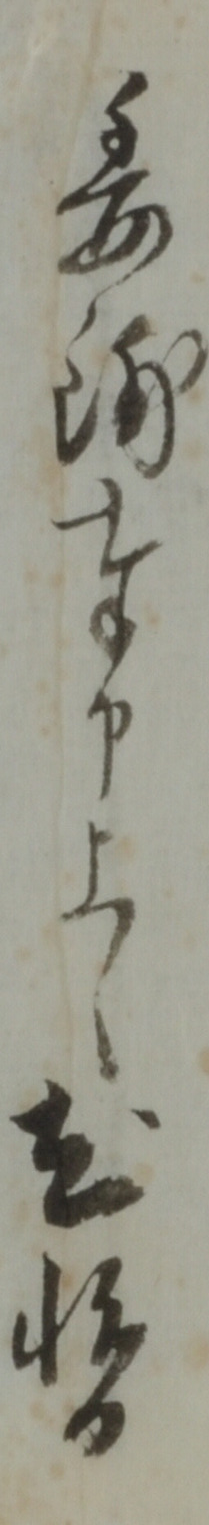委鋪奉申上候尤暫
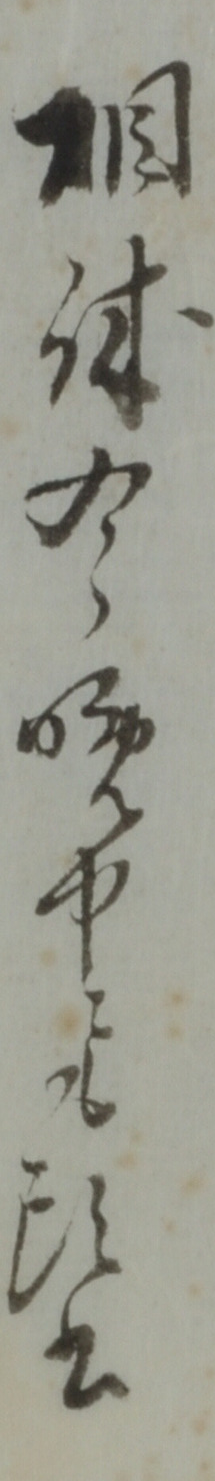相休今晩中ニも頭書
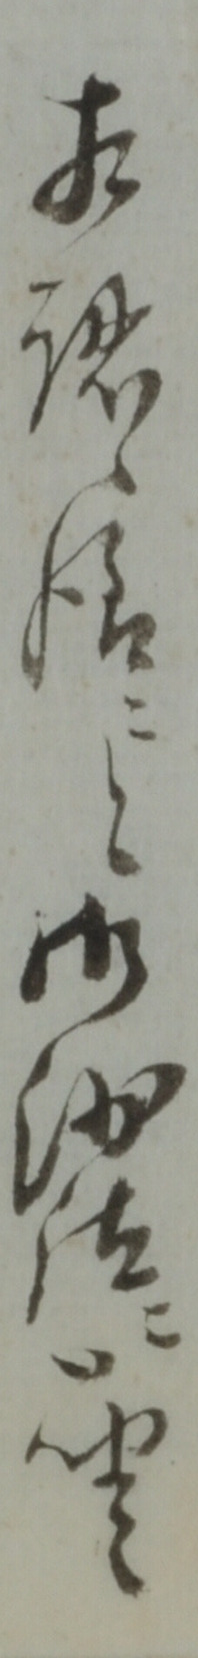相認候様ニも御沙汰御坐候
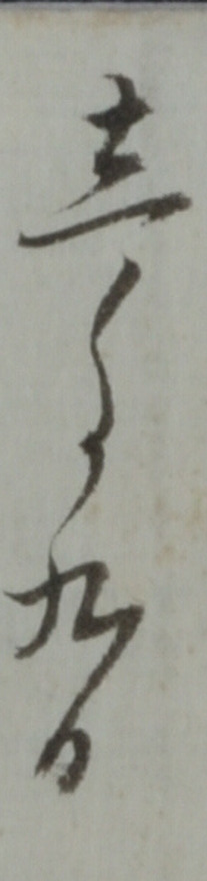十二月九日
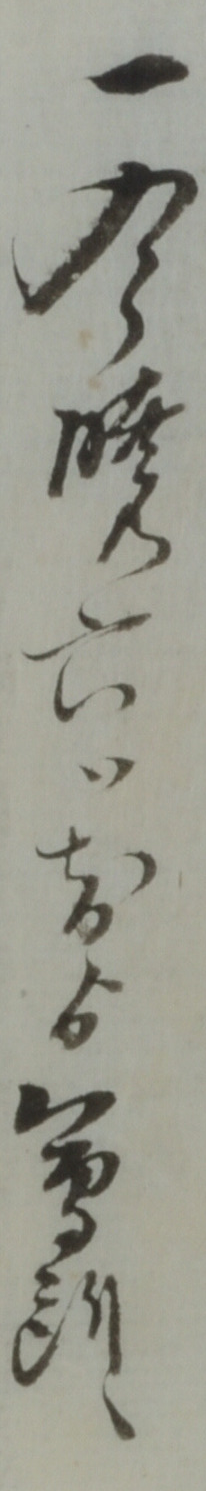一今暁六ツ前ゟ会所へ
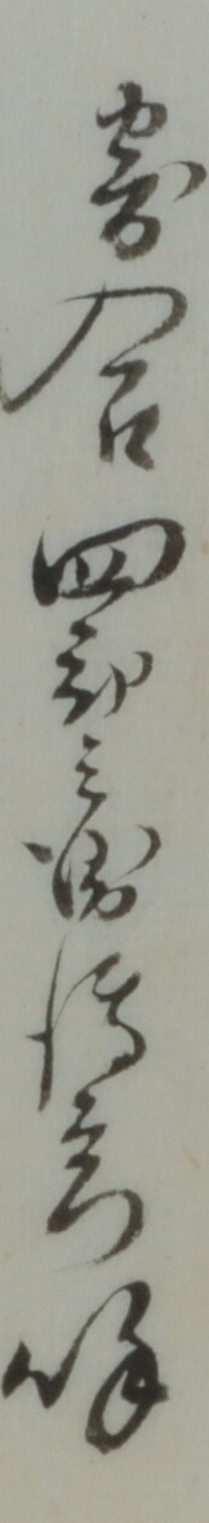寄合四郎兵衛伝左衛門呼
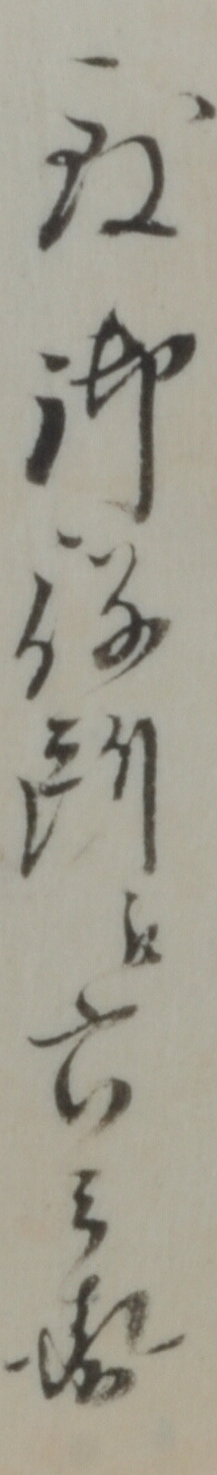致御役所江六兵衛
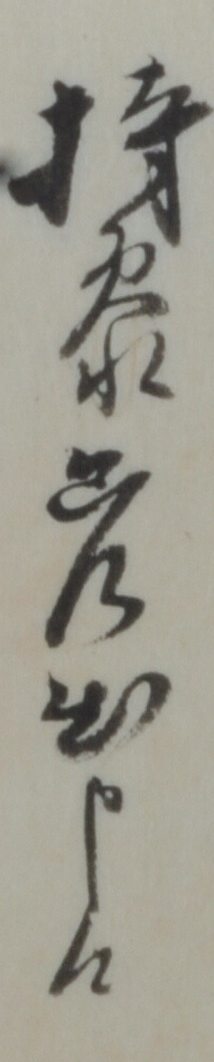持参差出申候

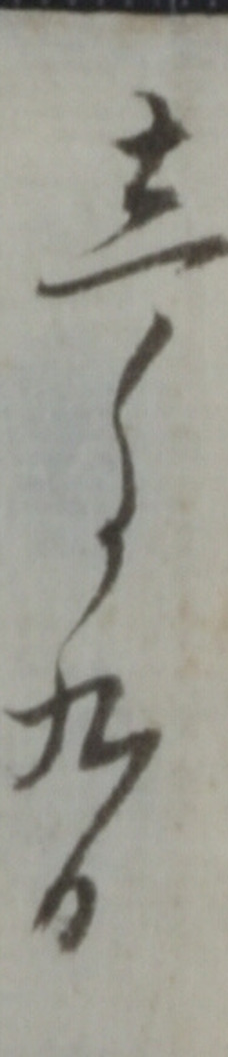十二月九日
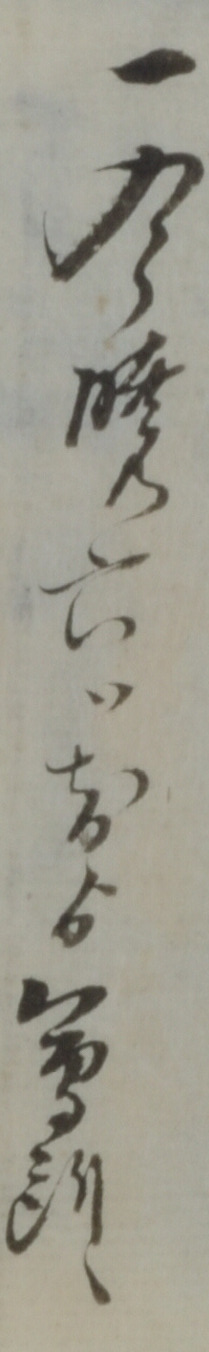一今暁六ツ前ゟ会所へ
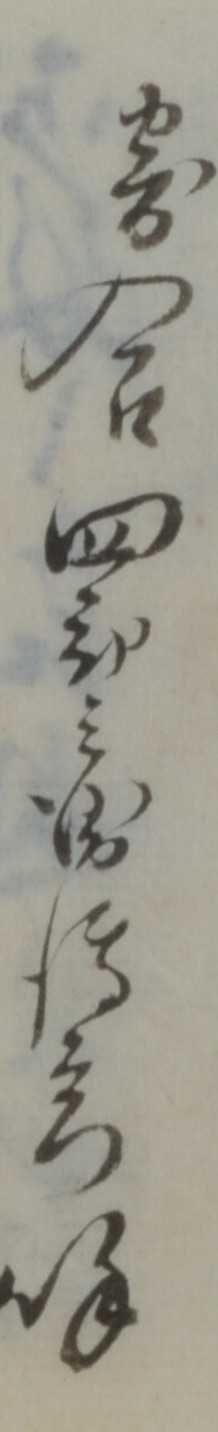寄合四郎兵衛伝左衛門呼
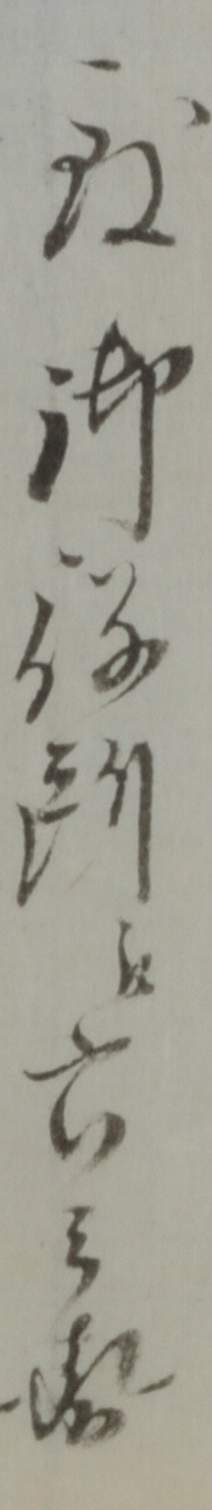致御役所江六兵衛
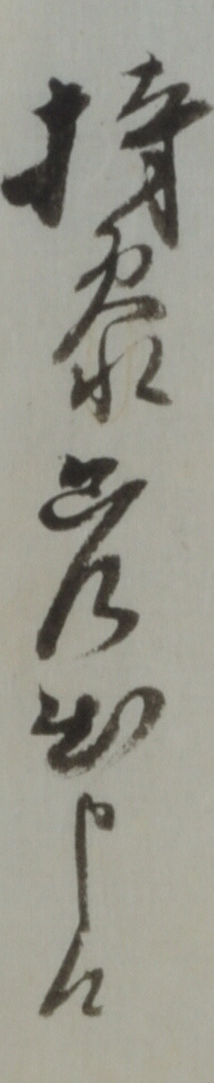持参差出申候

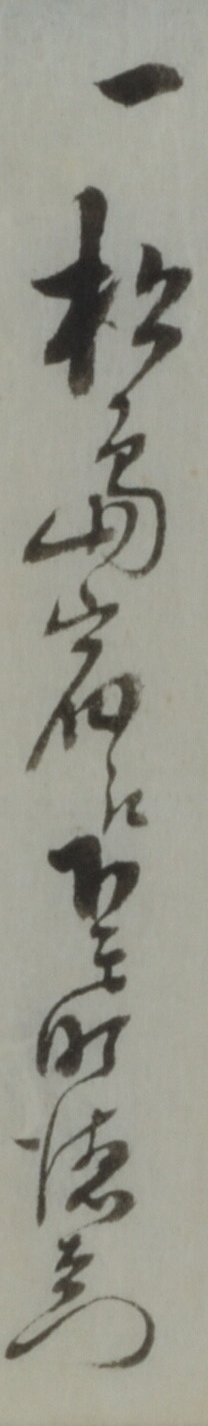一松嶋宿江下モ町徳右衛門
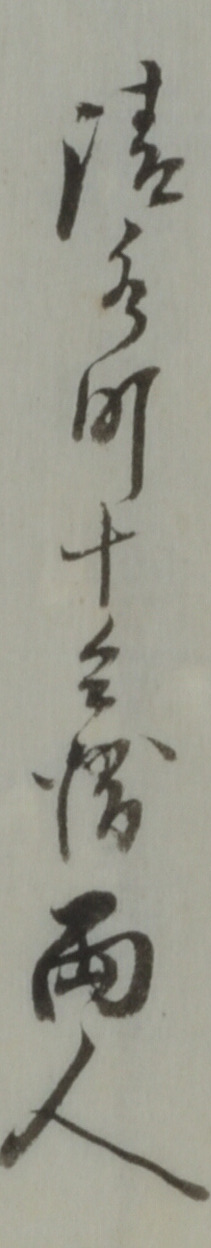清水町十兵衛両人
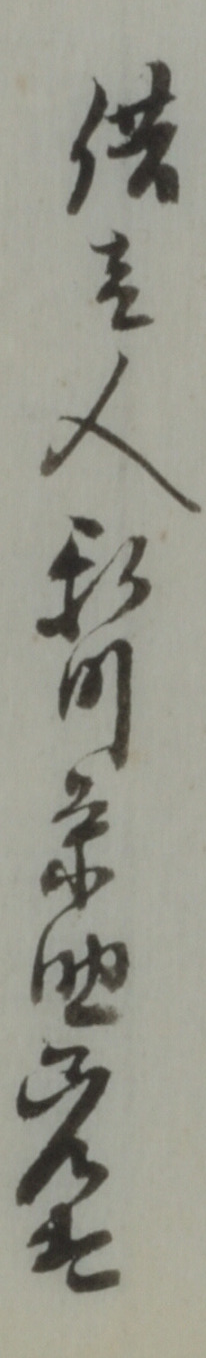供壱人新町京助差遣
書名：御勘定御普請役江戸御役人様諸事控
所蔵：伊那市立高遠町図書館・合同会社AMANE
